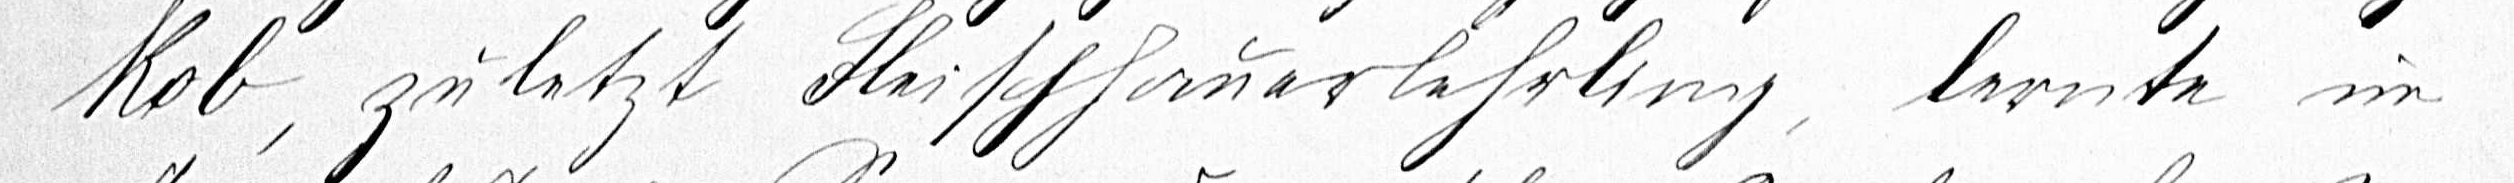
kob, zuletzt Fleischhauerlehrling, lernte im
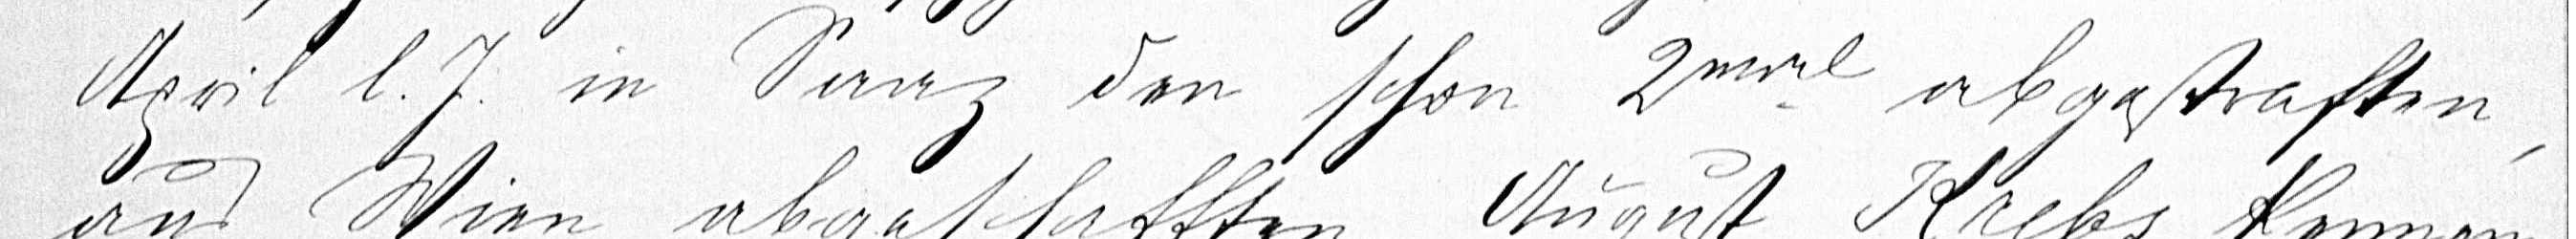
April l. J. in Saaz den schon 2mal abgestraften
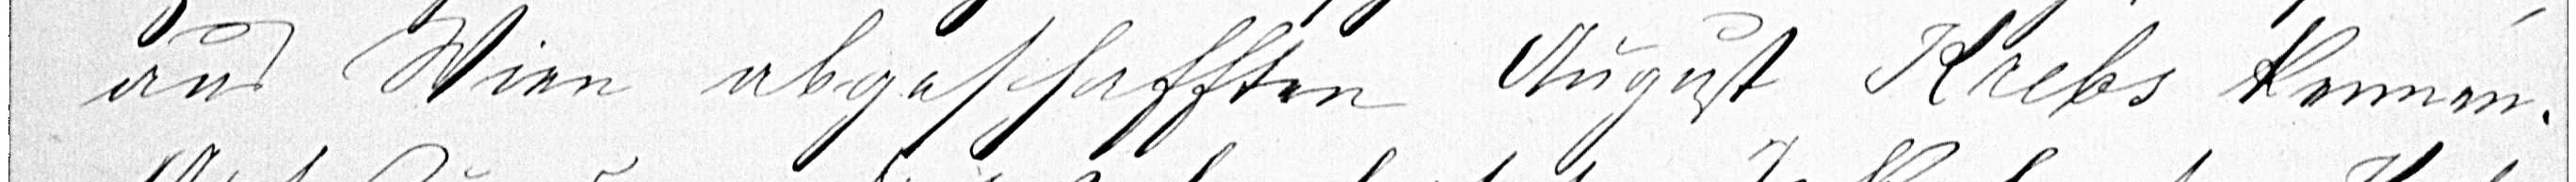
aus abgeschafften August Krebs kennen.
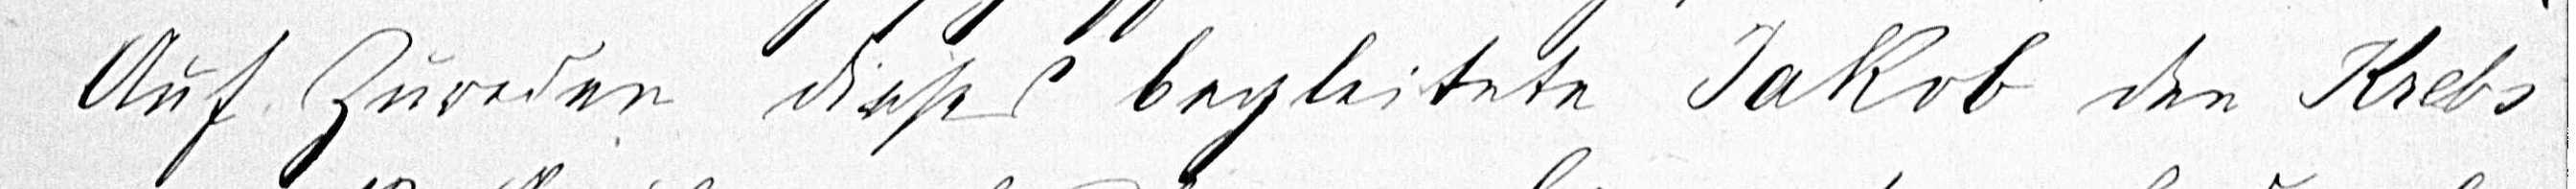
Auf Zureden dieses begleitete Jakob den Krebs
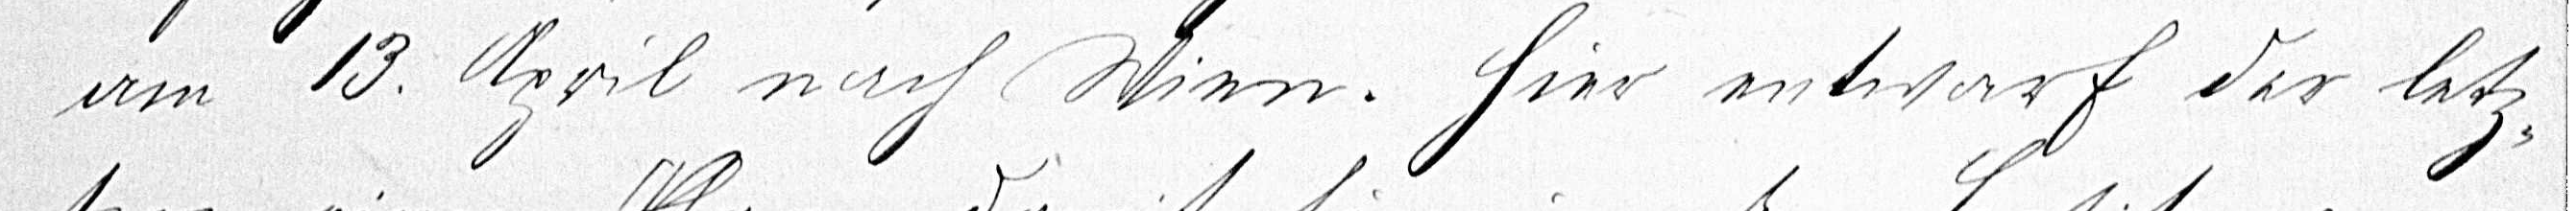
am 13. April nach Wien. Hier entwarf der letz¬
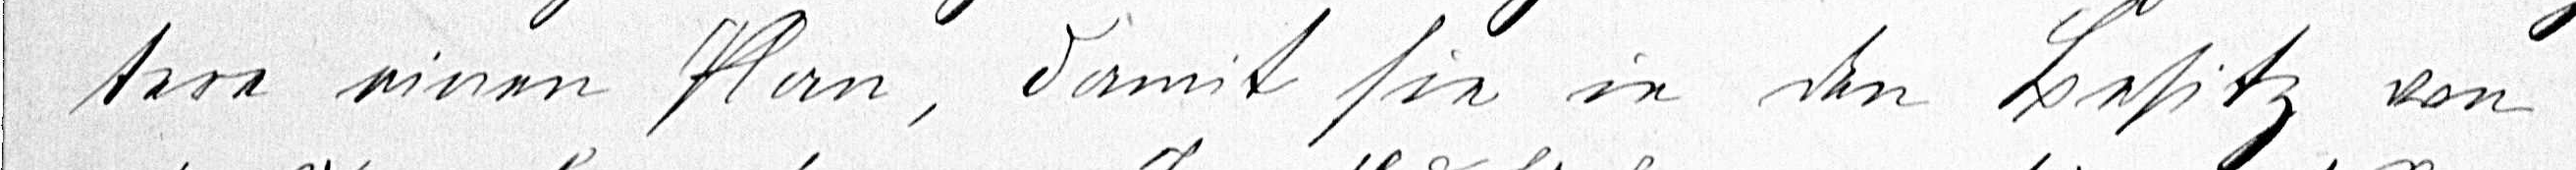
tere einen Plan, damit sie in den Besitz von
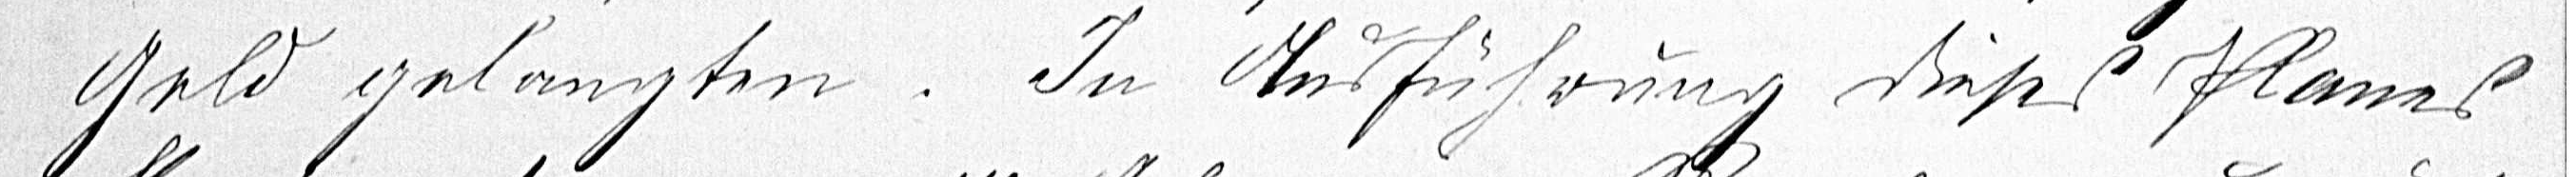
Geld gelangten. In Ausführung dieses Planes
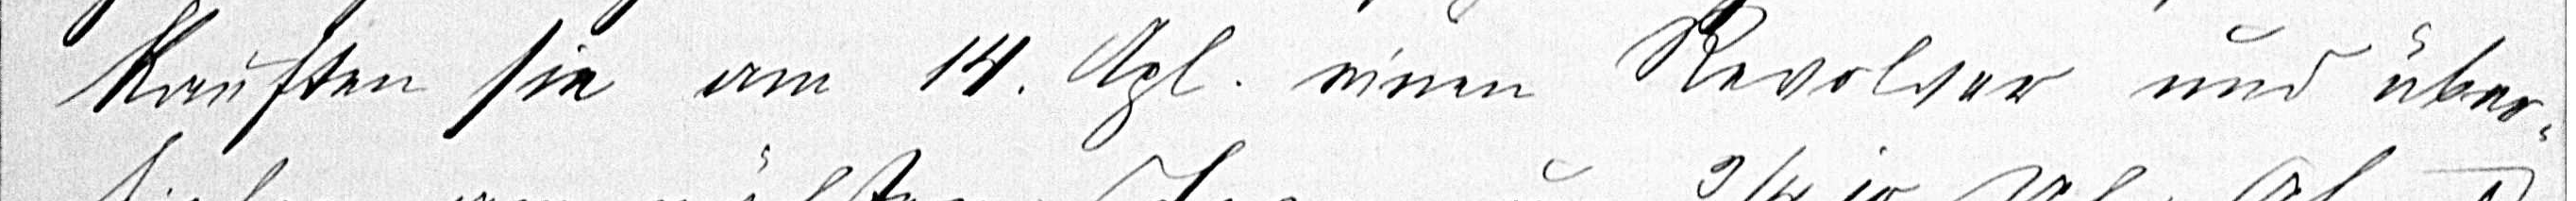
Kauften sie am 14. Apl. Einen Revolver und über¬
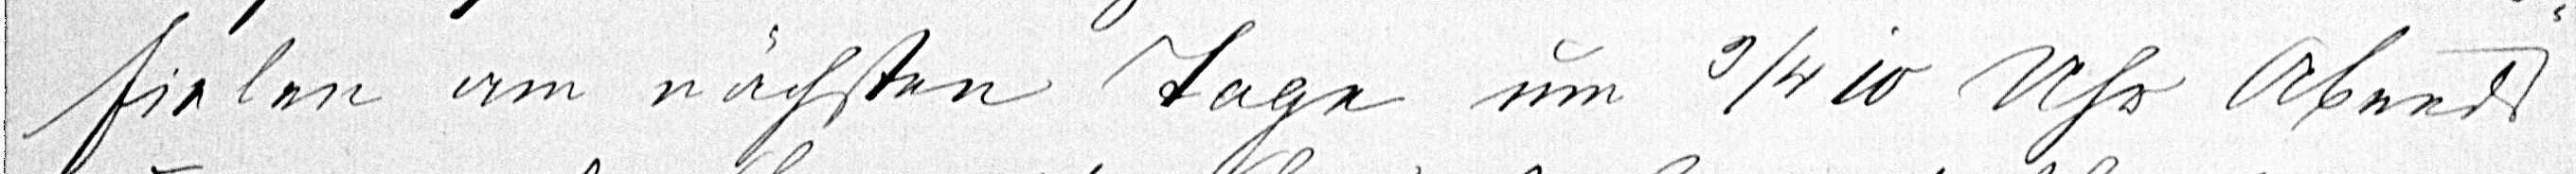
fielen am nächsten Tage um ¾ 10 Uhr Abends
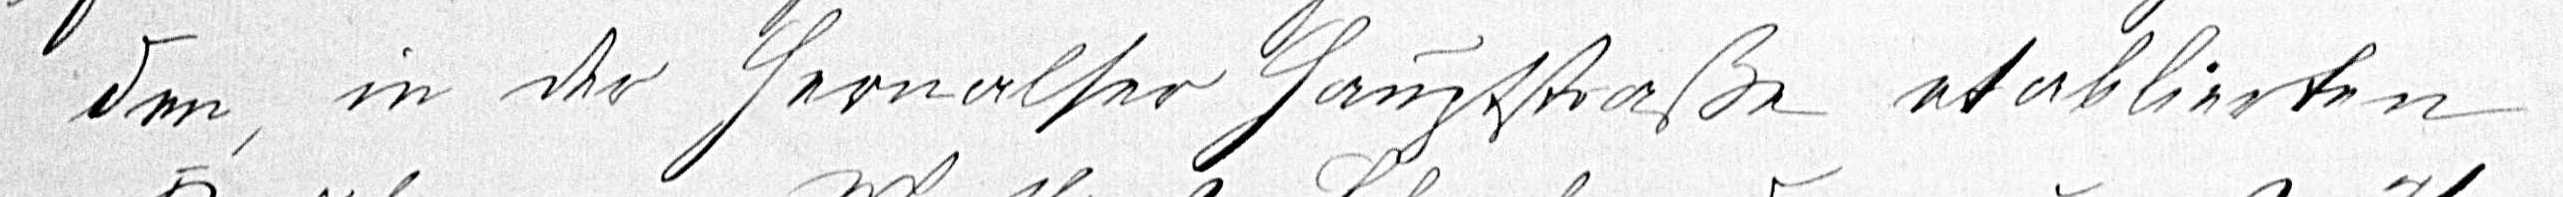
den, in der Hernalser Hauptstraße etablierten
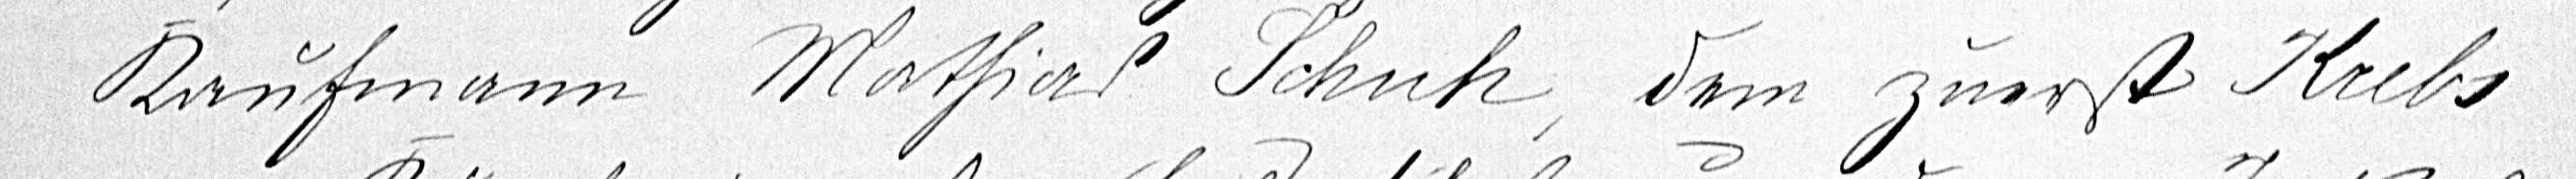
Kaufmann Mathias Schuh, dem zuerst Krebs
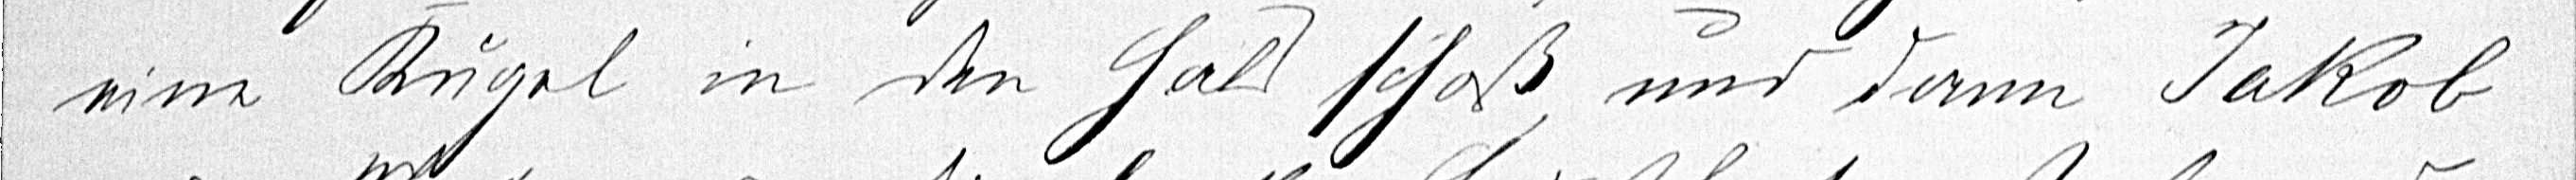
eine Kugel in den Hals schoß und dann Jakob
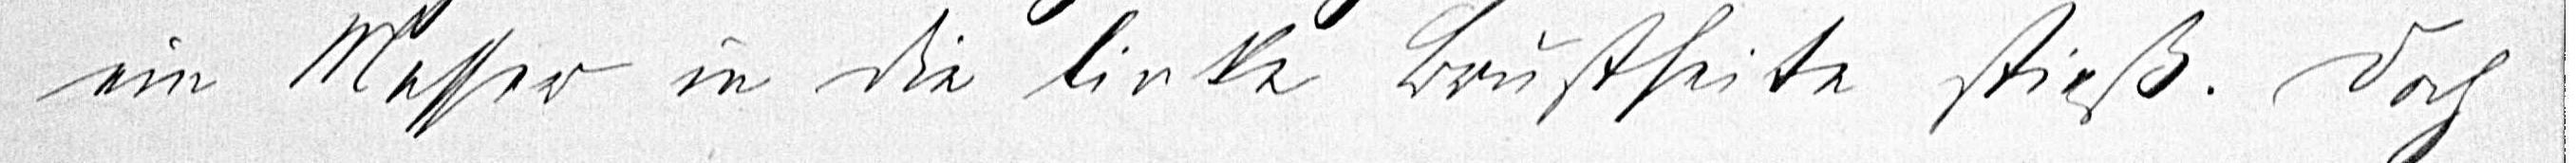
ein Messer in die linke Brustseite stieß. Doch
